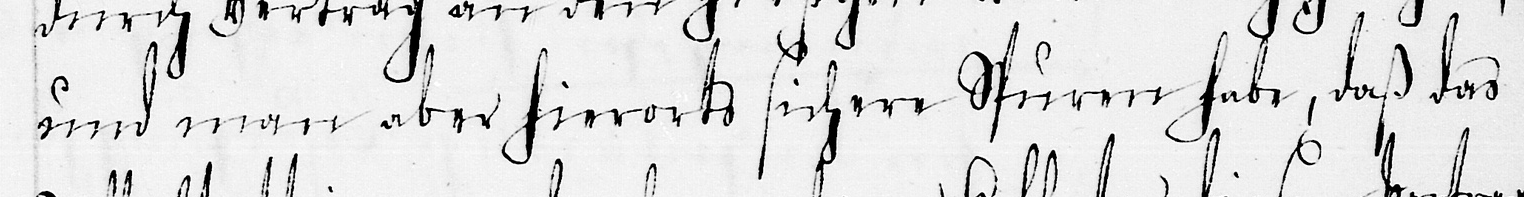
und man aber hierorts sichere Spuren habe, daß das
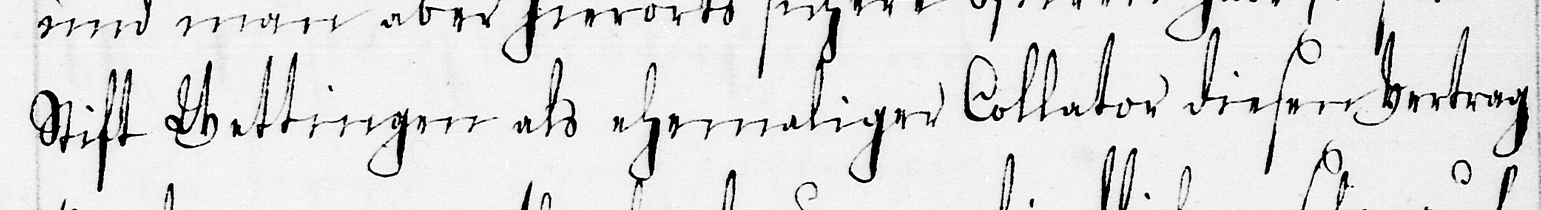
Stift Wettingen als ehemaliger Collator diesen Vertrag
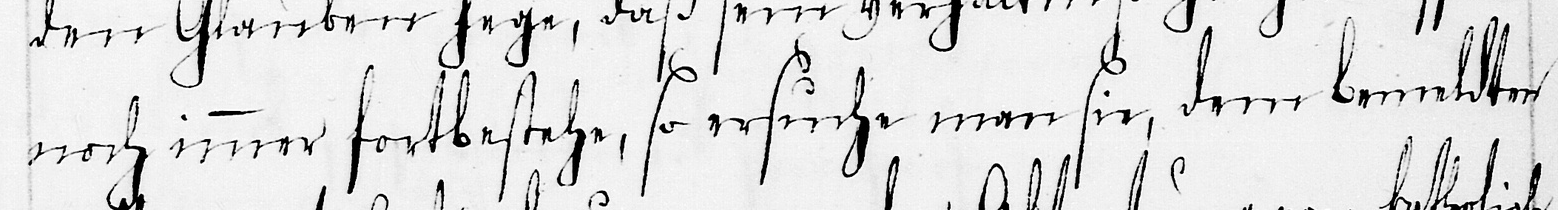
noch immer fortbestehe, so ersuche man sie, dem bemeldten
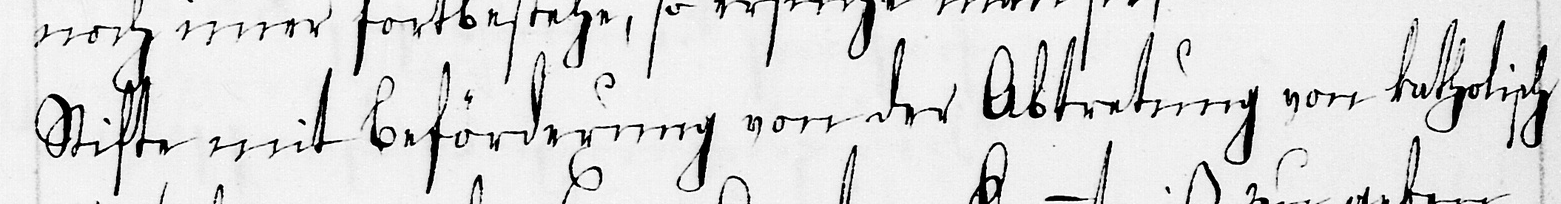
Stifte mit Beförderung von der Abtretung von katholisch
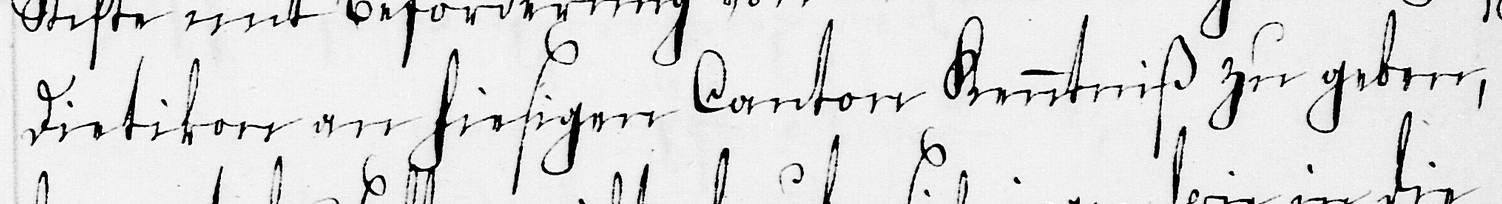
Dietikon an hiesigen Canton Kenntniß zu geben,
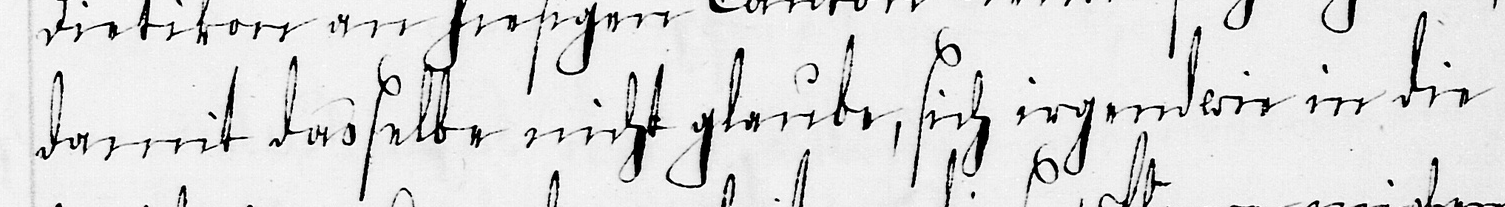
damit dasselbe nicht glaube, sich irgendwie in die
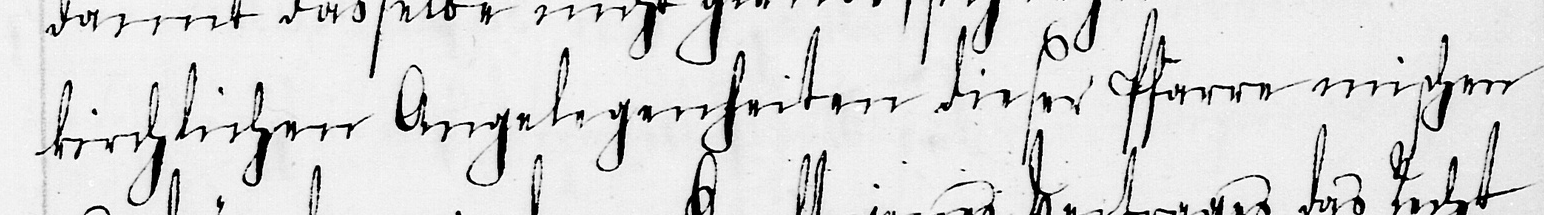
kirchlichen Angelegenheiten dieser Pfarre mischen
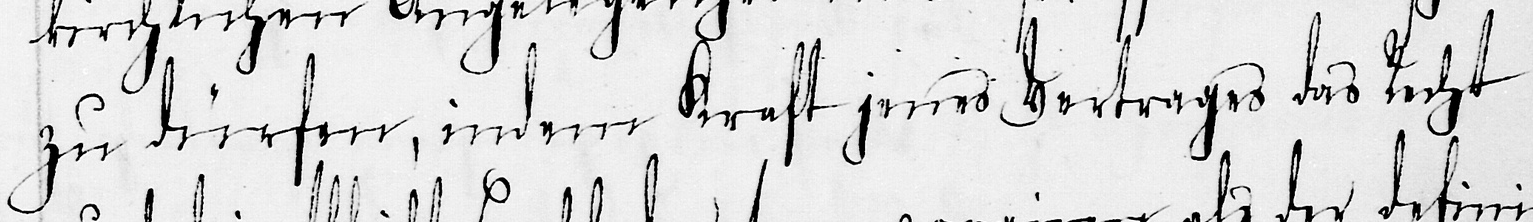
zu dürfen, indem Kraft jenes Vertrages das Recht
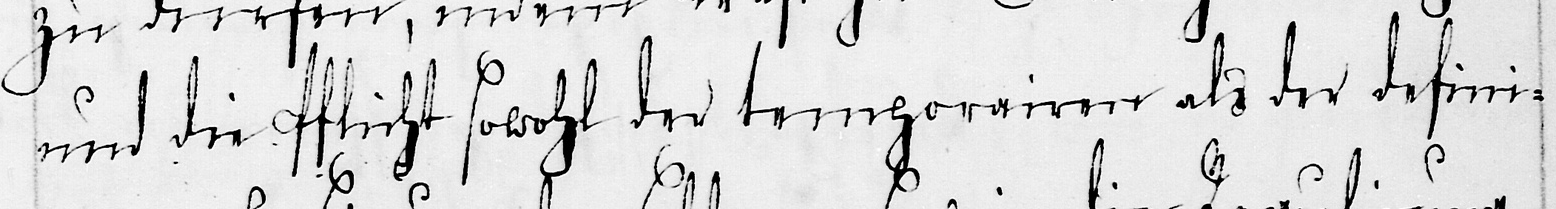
und die Pflicht sowohl der temporairen als der defini¬
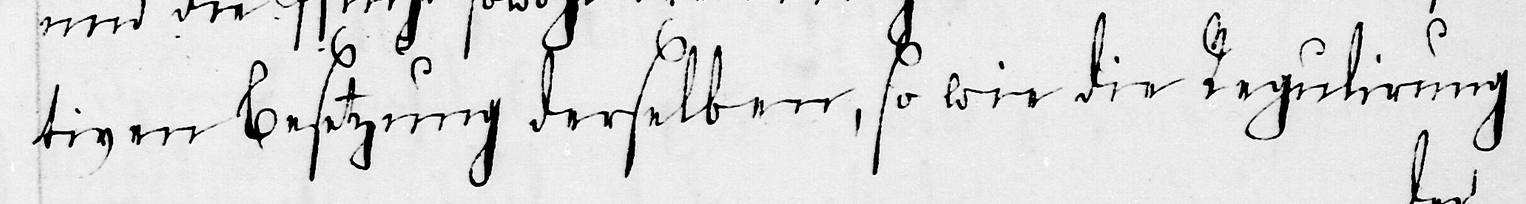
tiven Besetzung derselben, so wie die Regulirung
